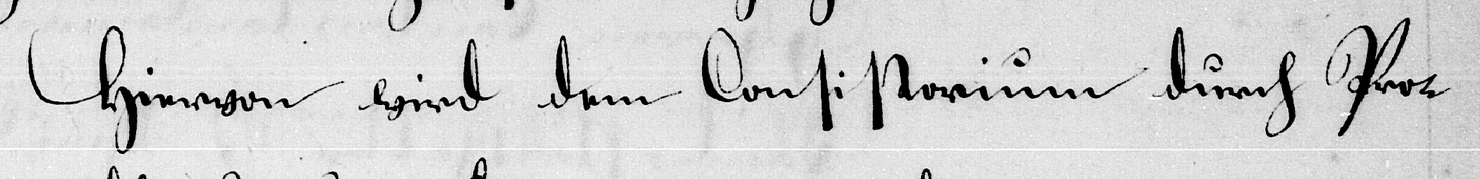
Hiervon wird dem Consistorium durch Pro¬
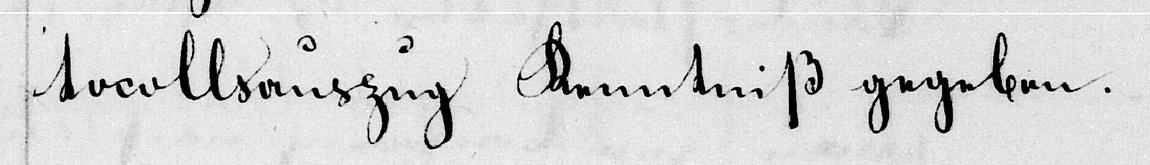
tocollsauszug Kenntniß gegeben.
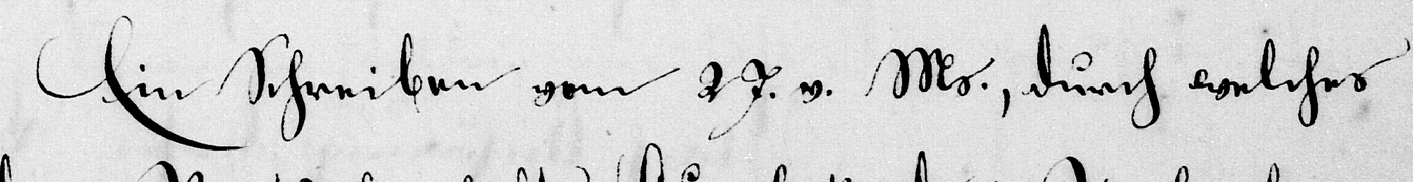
Ein Schreiben vom 27. v. Ms., durch welches
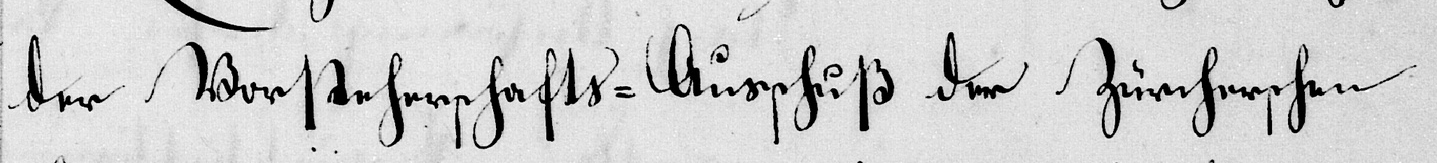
der Vorsteherschafts-Ausschuß der Zürcherschen
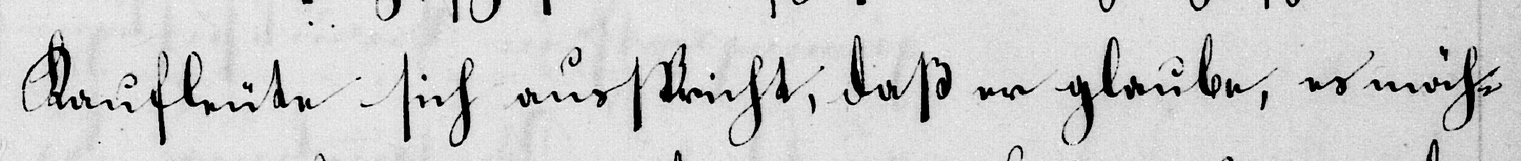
Kaufleute sich ausspricht, daß er glaube, es möch¬
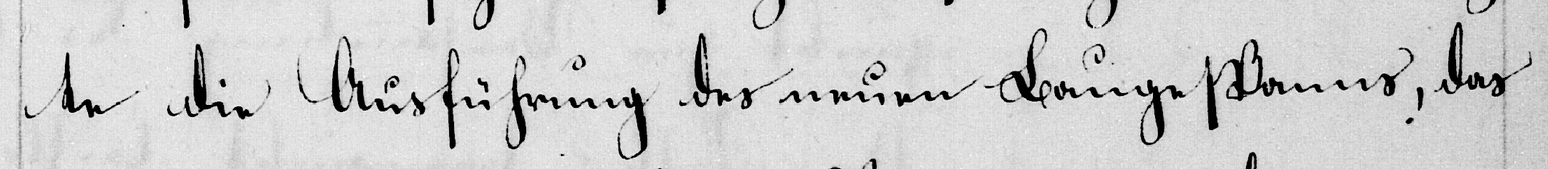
te die Ausführung des neuen Baugespanns, das
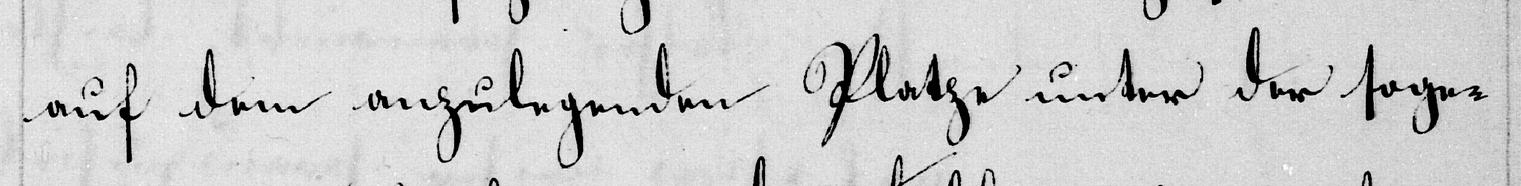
auf dem anzulegenden Platze unter der soge¬
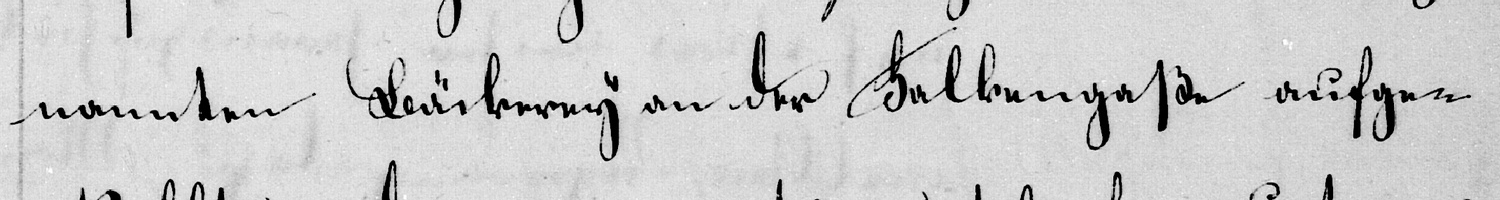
nannten Bäckerey an der Falkengaße aufge¬
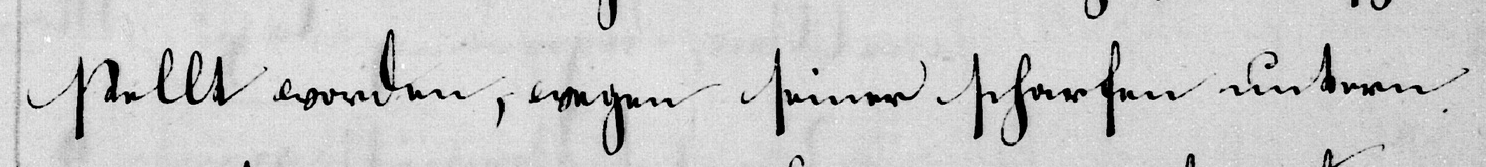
stellt worden, wegen seiner scharfen untern
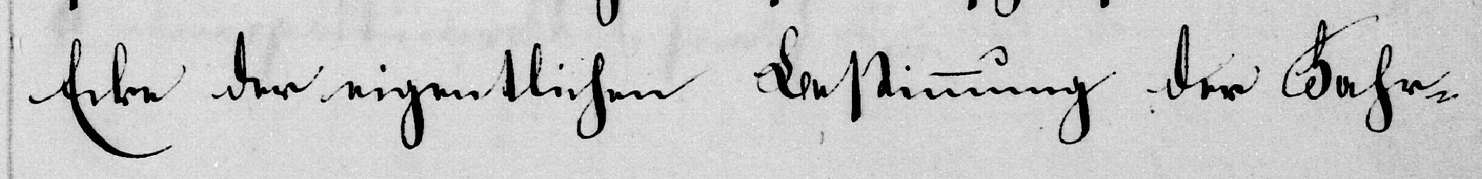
Ecke der eigentlichen Bestimmung der Fahr-
